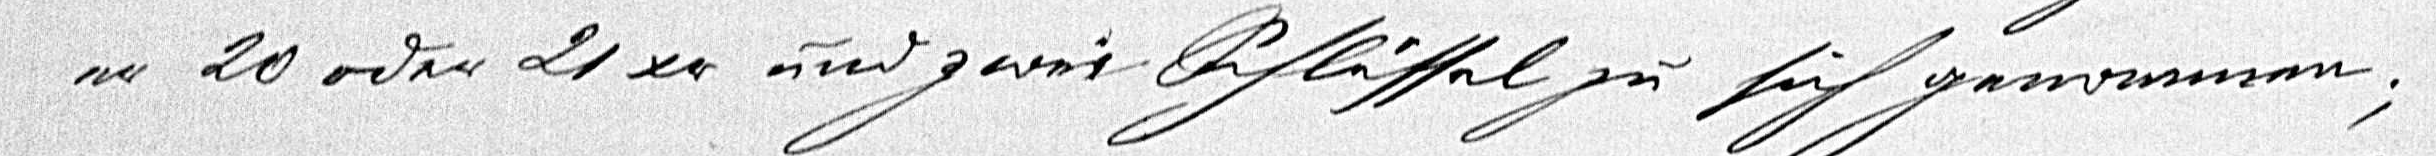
er 20 oder 21 kr un zwei Schlüssel zu sich genommen;
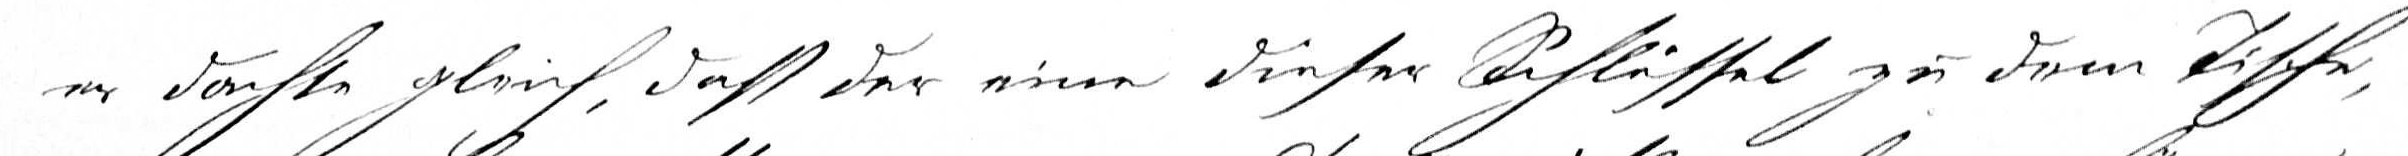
er dachte gleich, daß der einen dieser Schlüssel zu dem Tisch,
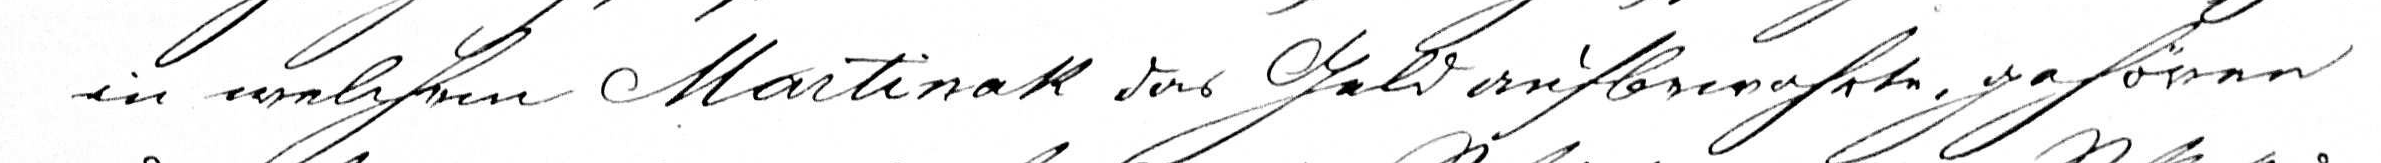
in welchem Martinak das Geld aufbewahrte, gehören
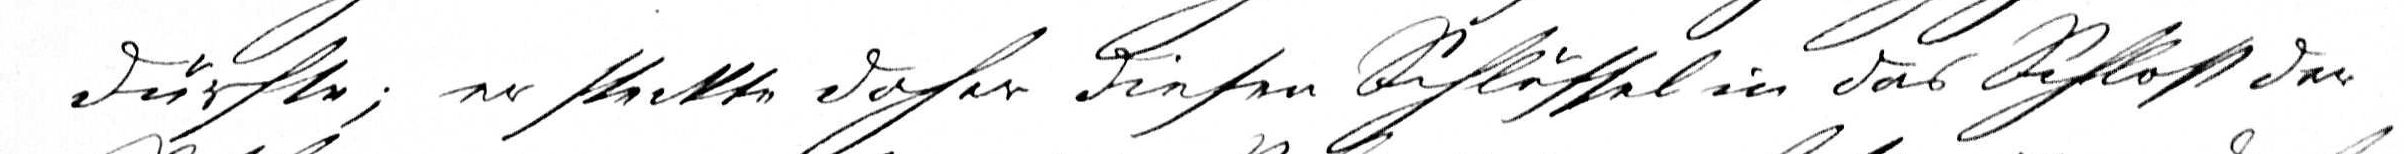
dürfte; er steckte daher diesen Schlüssel in das Schloß der
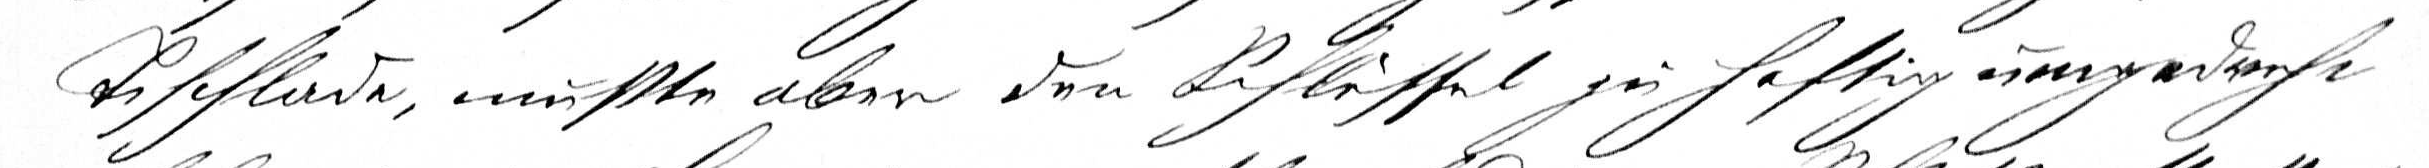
Tischlade, mußte aber den Schlüssel zu Heftig umgedreht
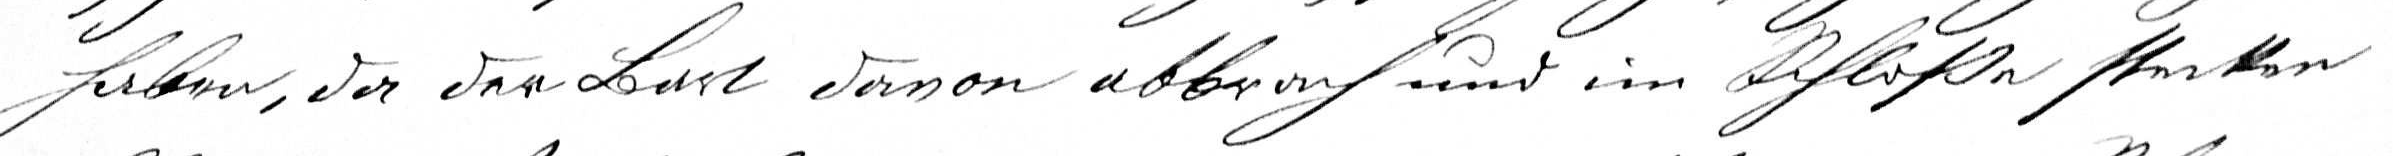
haben, da der Bart davon abbruch und im Schloße stecken
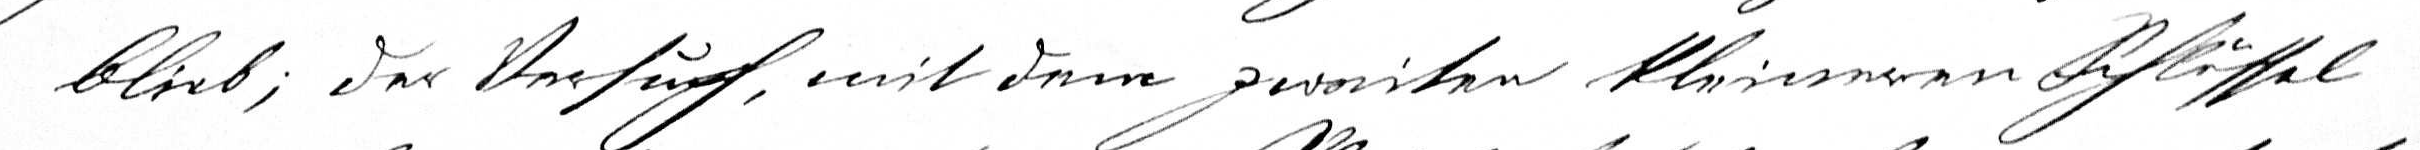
blieb; der Versuch, mit dem zweiten kleineren Schlüssel
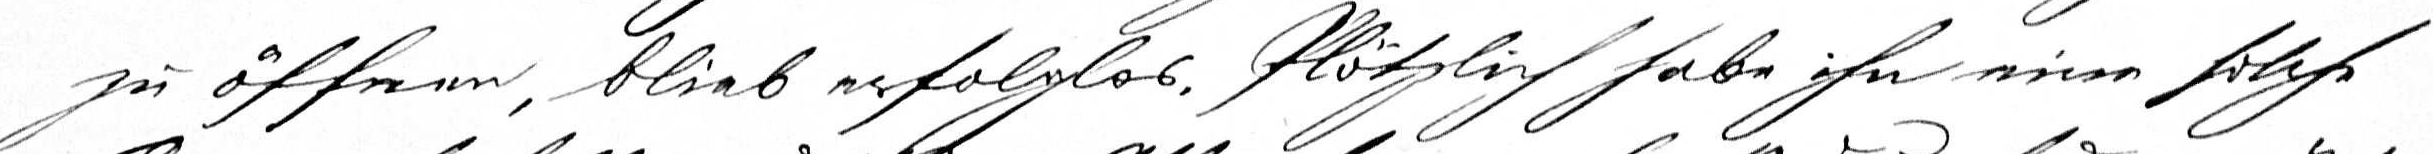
zu öffnen, blieb erfolglos. Plötzlich habe ihn eine solche
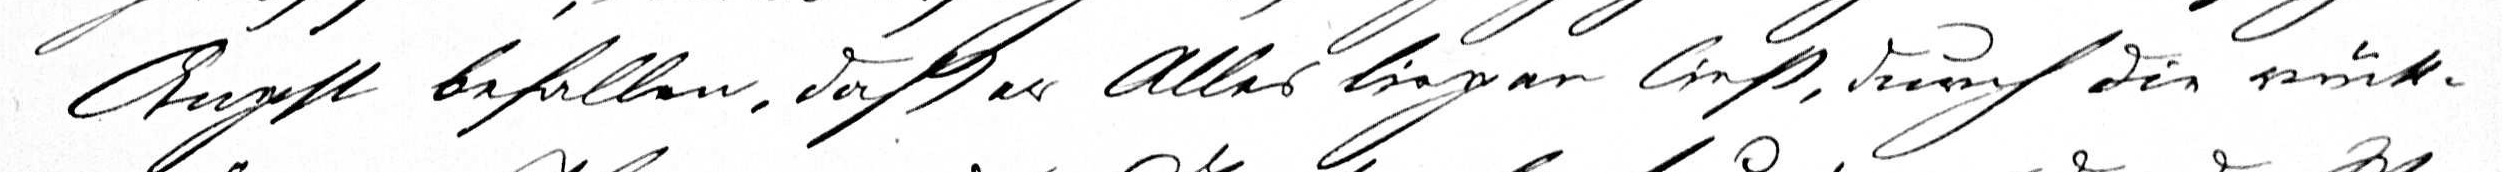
Angst befallen, daß er Alles liegen ließ, durch die rück¬
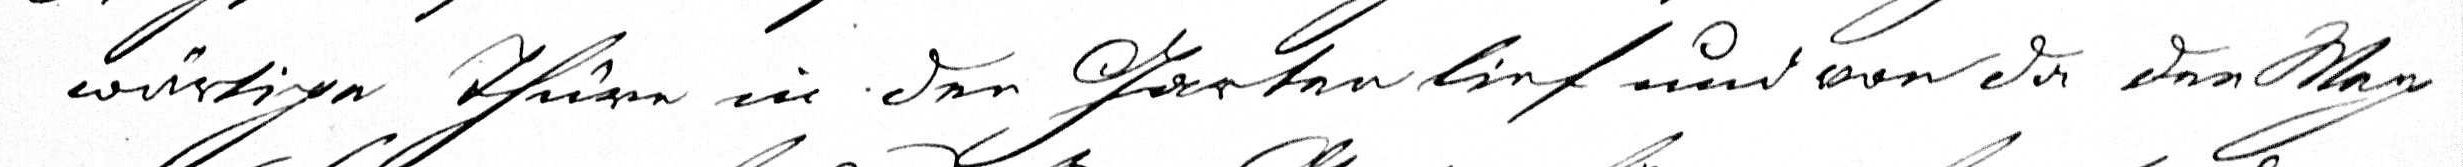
wärtige Thüre in der Garten lief und von da den Weg
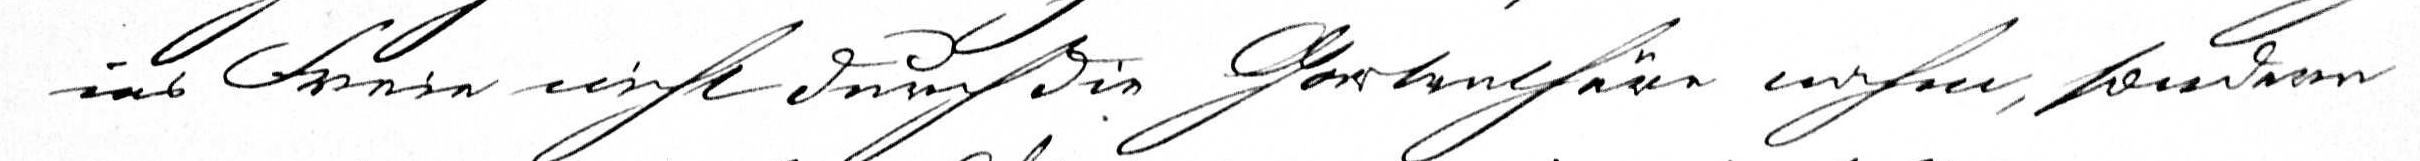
ins Freie nicht durch die Gartenthüre nahm, sondern
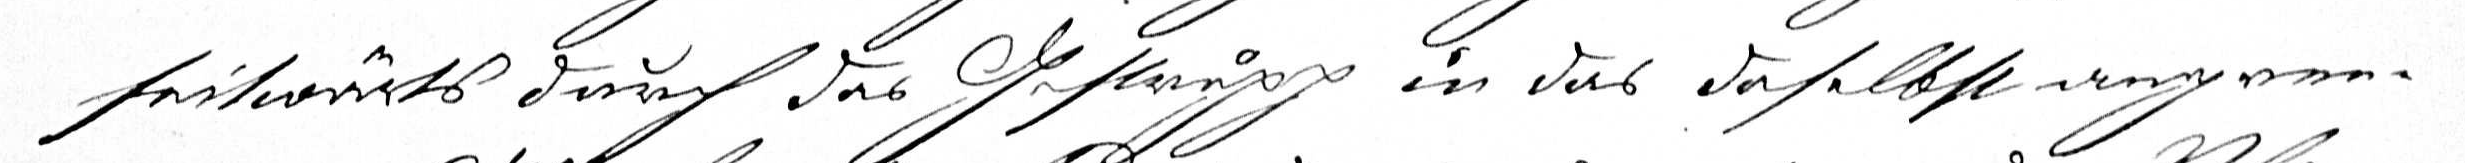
seitwärts durch das Gestrupp in das daselbst angren¬
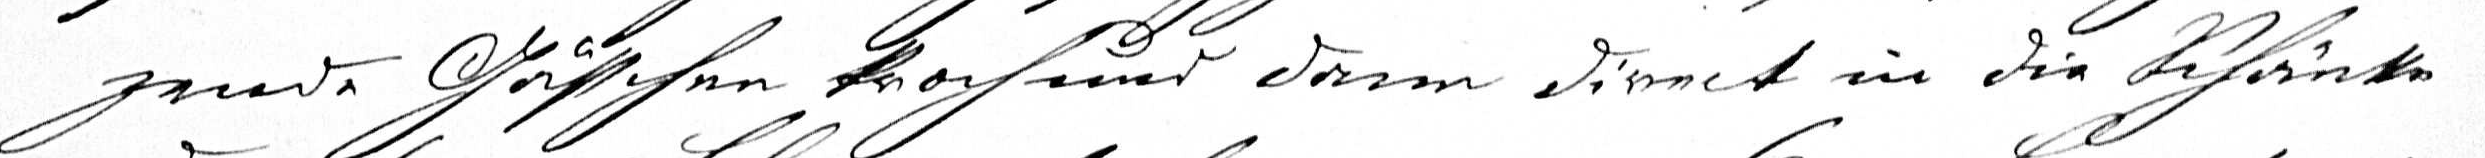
zende Gäßchen krochend dann direct in die Schänke
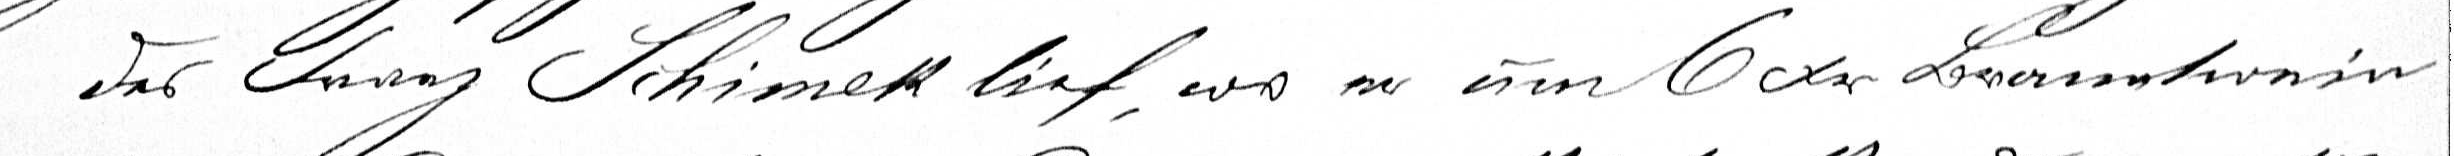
des Franz Schimek lief, wo er um 6 der Branntwein
